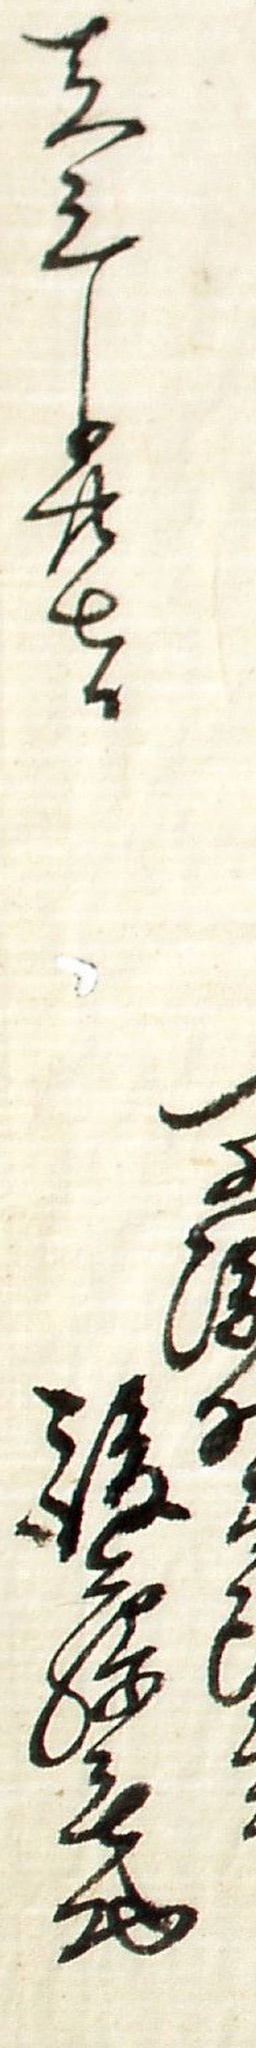亥三月廿七日後藤壱助
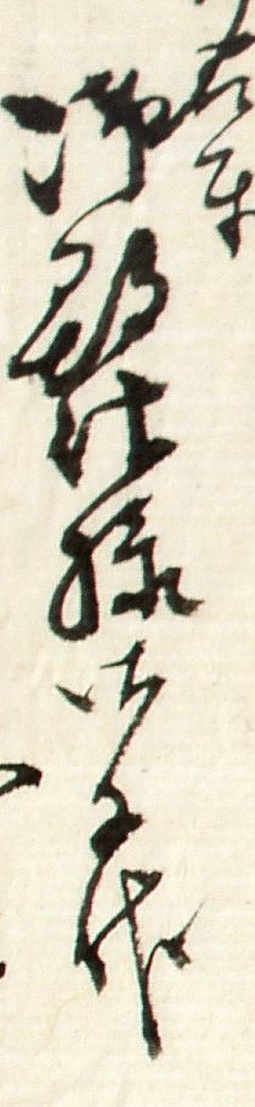御郡代様御手代
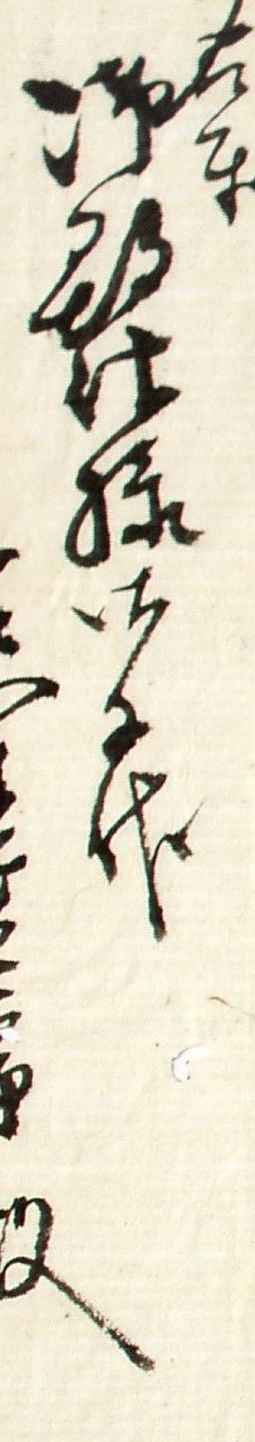御郡代様御手代
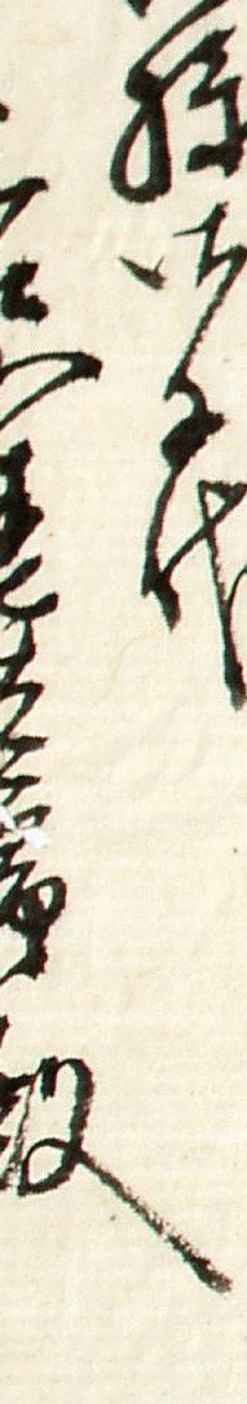三沢春太郎殿

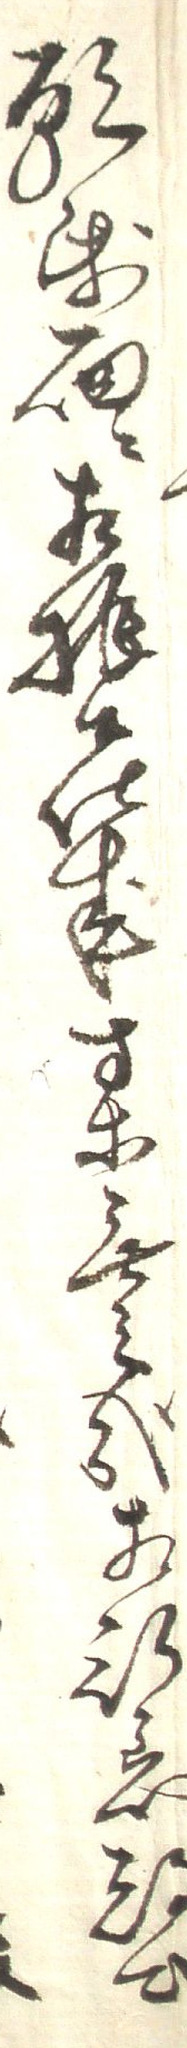願帋面ニ相振候仕成方等無之哉相行着願出
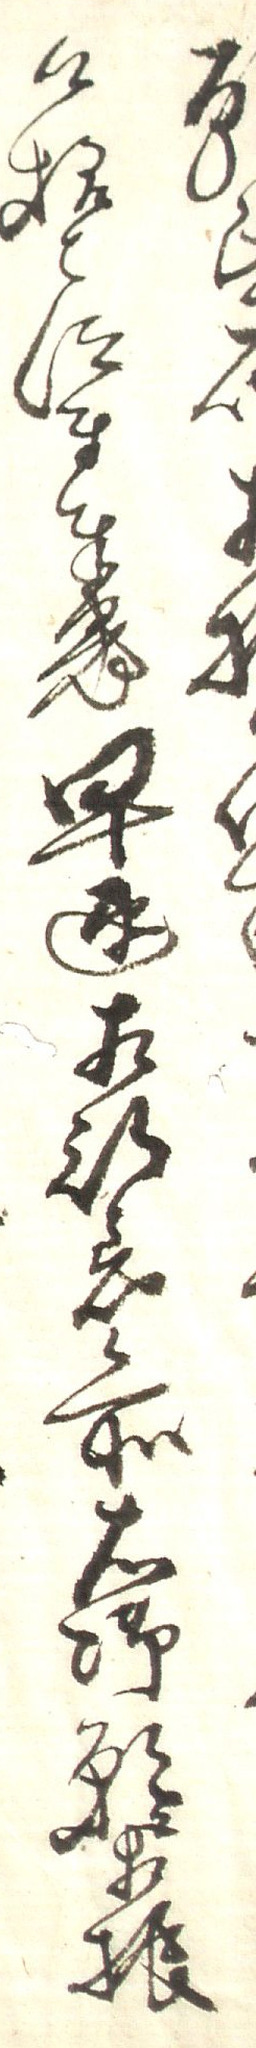候様被仰付奉畏早速相行着候所右御願ニ相振
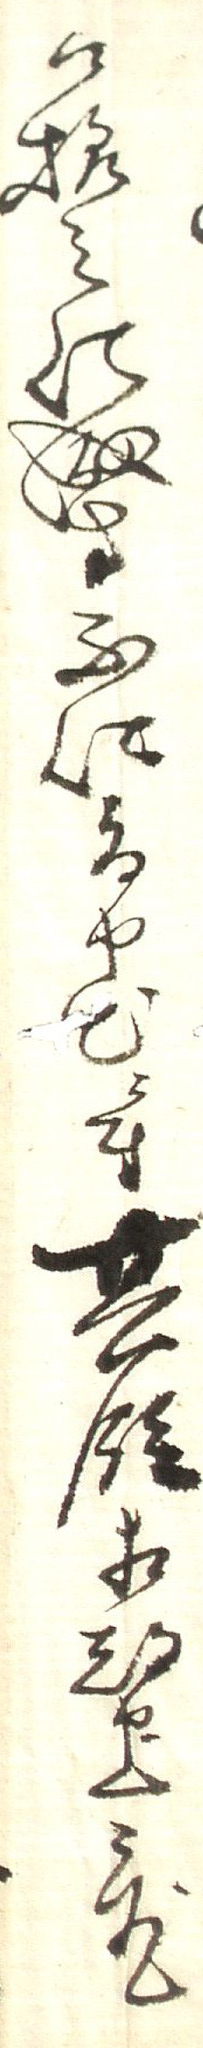候様之仕成方不仕旨申出ニ付其段相願申上置
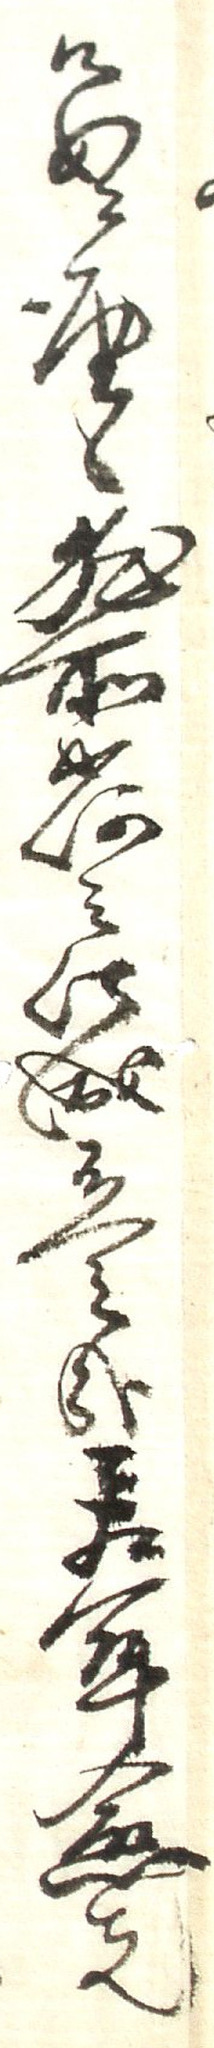候義ニ御座候然所如何之仕成有之哉被相聞愈先
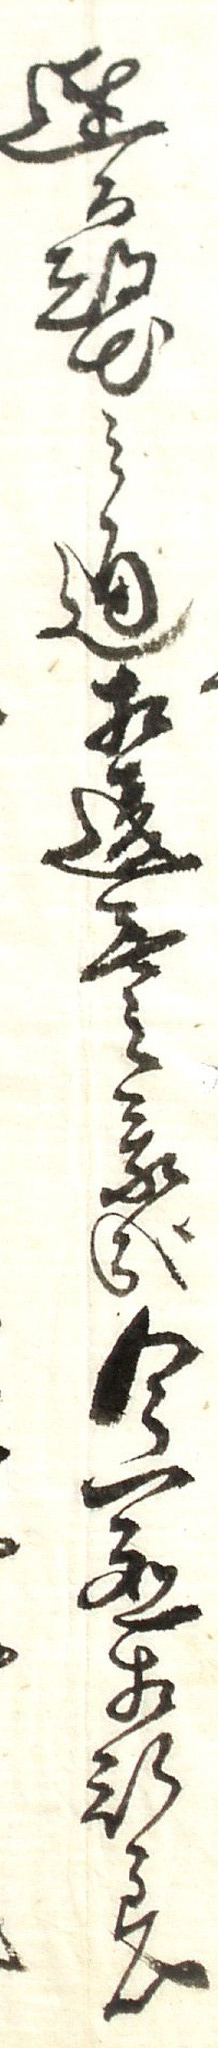達而願出之通相違無之義哉今一應相行着
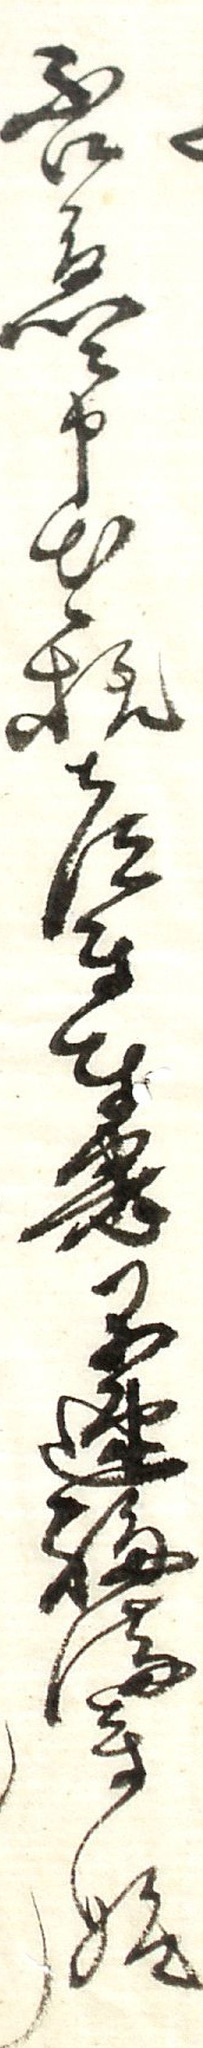否應ニ申出候様被仰付奉畏早速福満寺始
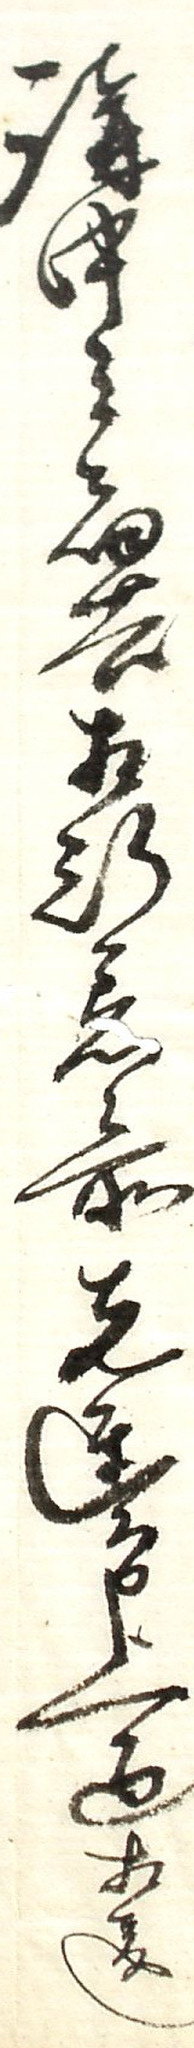講中之者共相行着候所先達而申上通相違
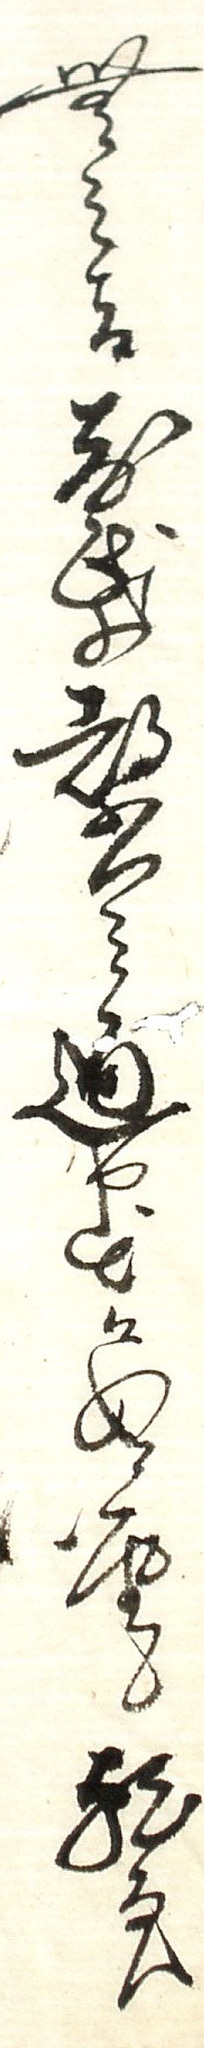無之旨別帋願書之通申出候義ニ御座候就而ハ
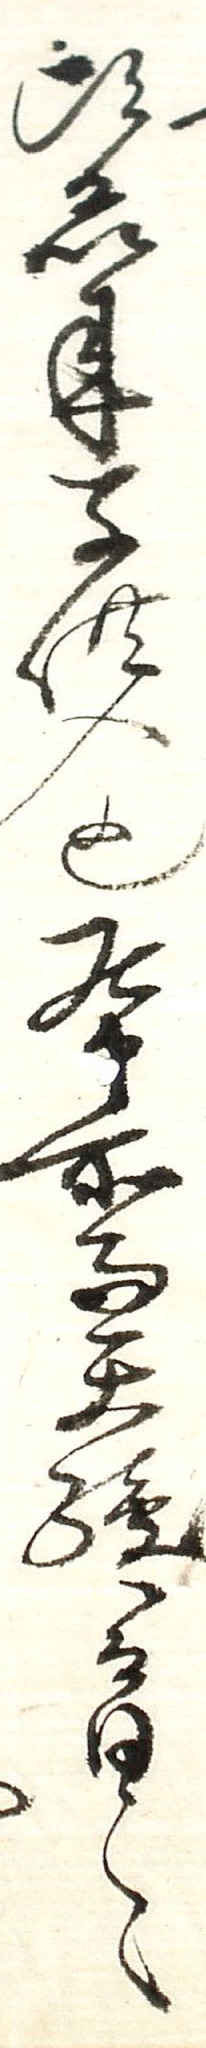頃日以来子供入込居申所雨天続ニ而日々
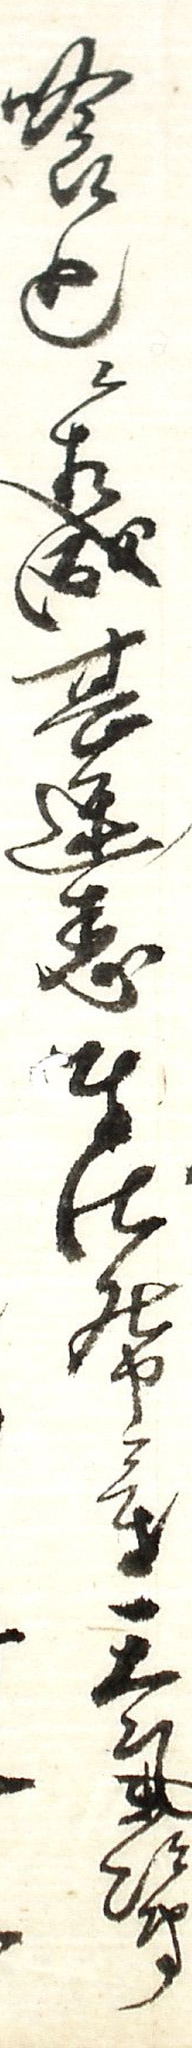喰込ニ相成甚迷惑奉仕居申ニ付天気次第
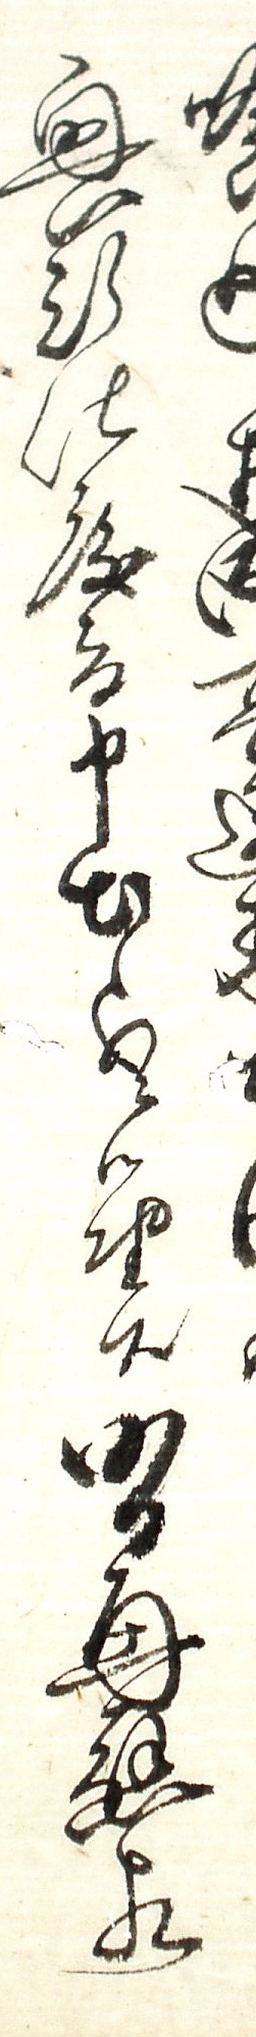興行仕度旨申出候様ニ御座候仍而再應相
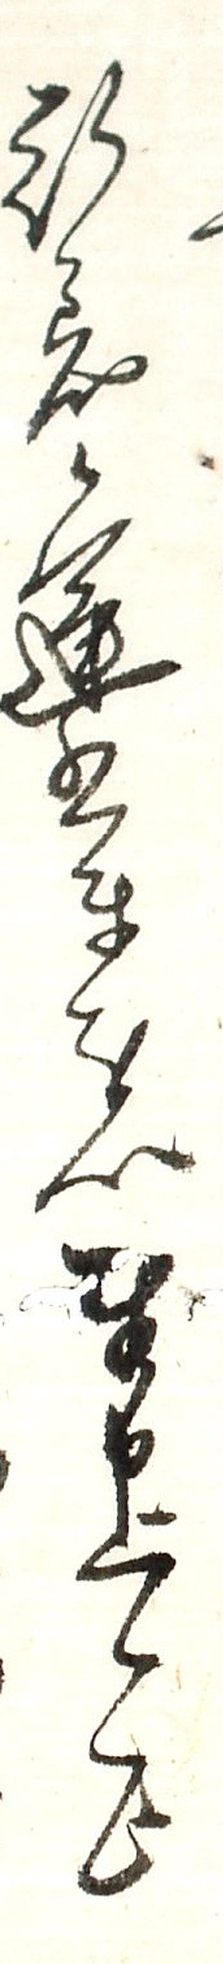行着候運書付を以奉申上候以上
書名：早渕村福満寺浄瑠璃再応行着添書ひかへ
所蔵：鳴門教育大学 Naruto University of Education
